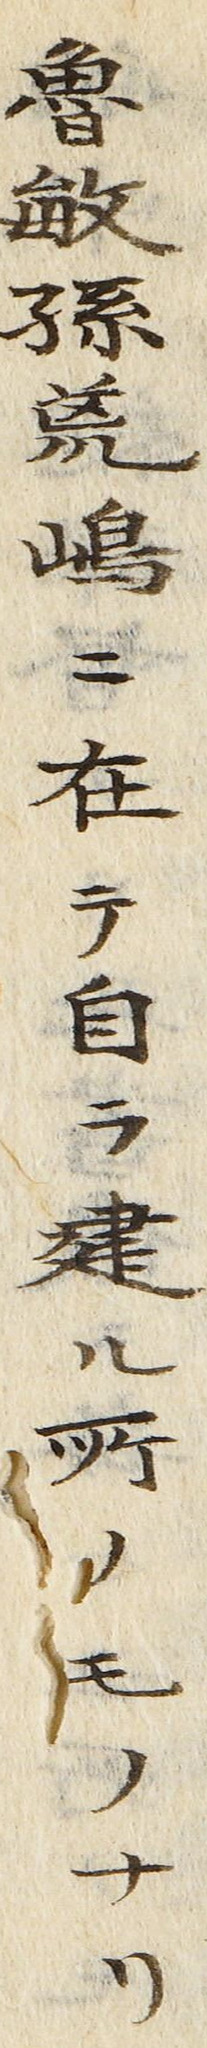魯敏孫荒島ニ在テ自ラ建ル所ノモノナリ
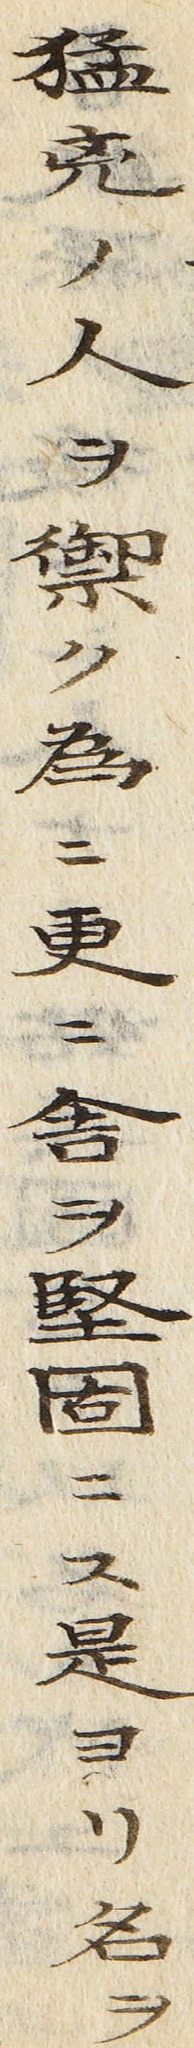猛兇ノ人ヲ禦ク為ニ更ニ舎ヲ堅固ニス是ヨリ名ヲ
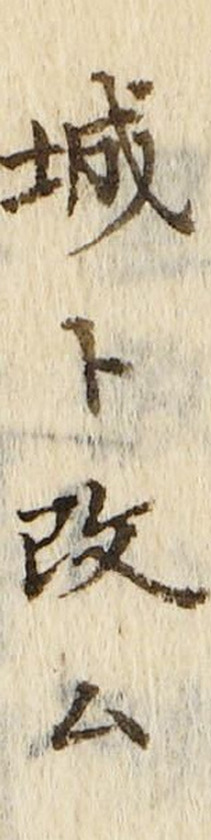城ト改ム
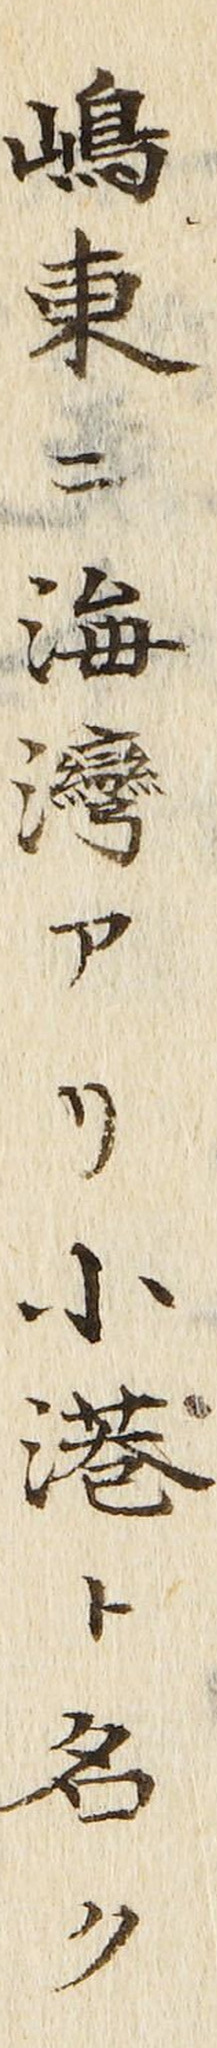島東ニ海湾アリ小港ト名ク
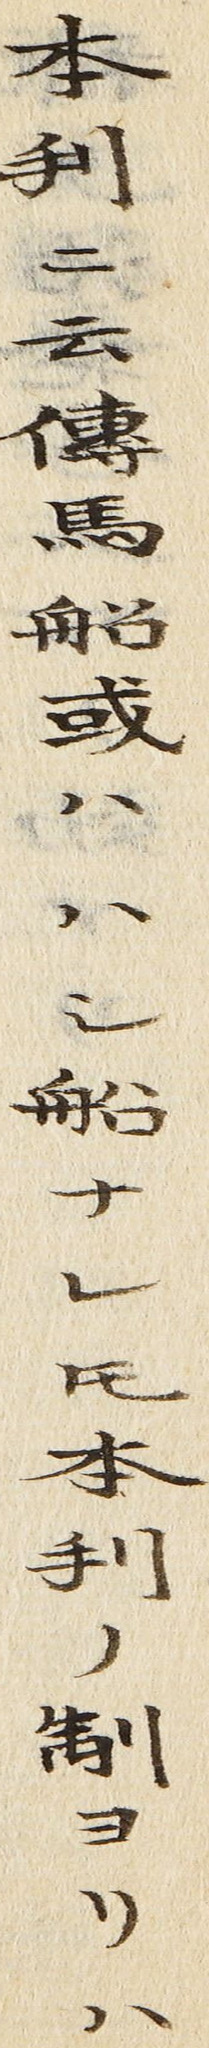本邦ニ云伝馬船或ハハシ船ナレトモ本邦ノ制ヨリハ
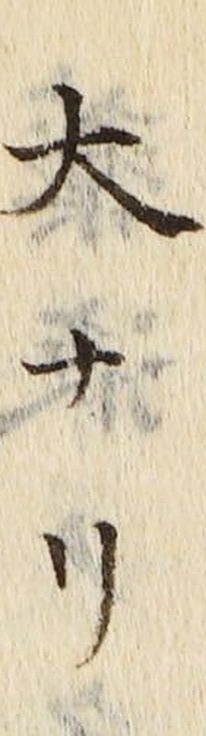大ナリ
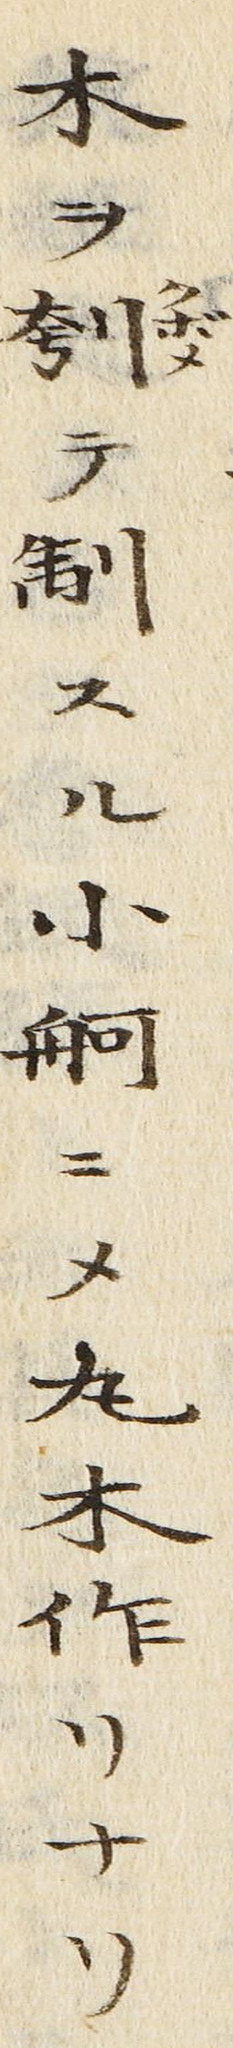木ヲ刳テ制スル小舸ニシテ丸木作リナリ
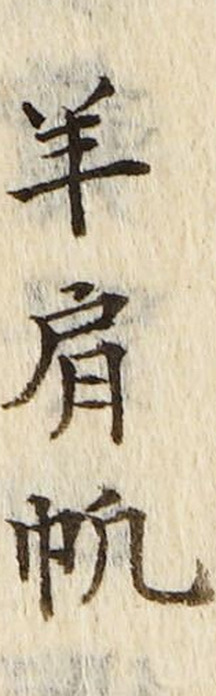羊肩帆
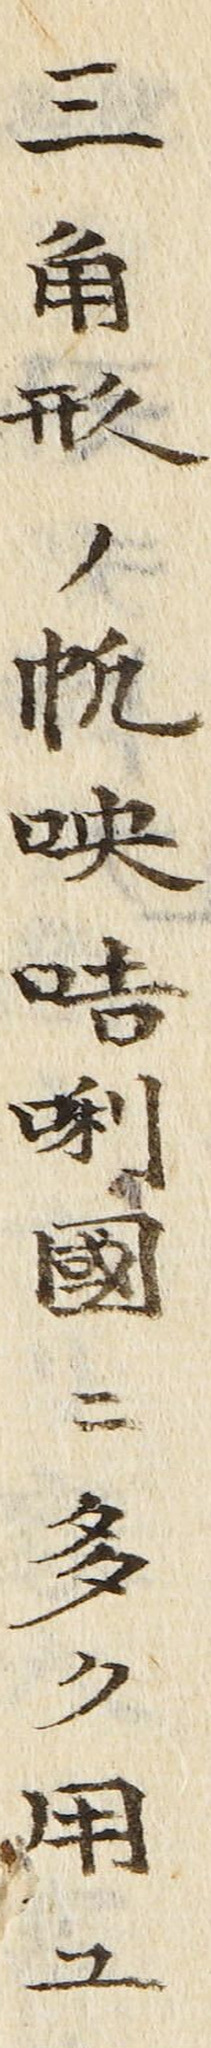三角形ノ帆咉咭唎国ニ多ク用ユ
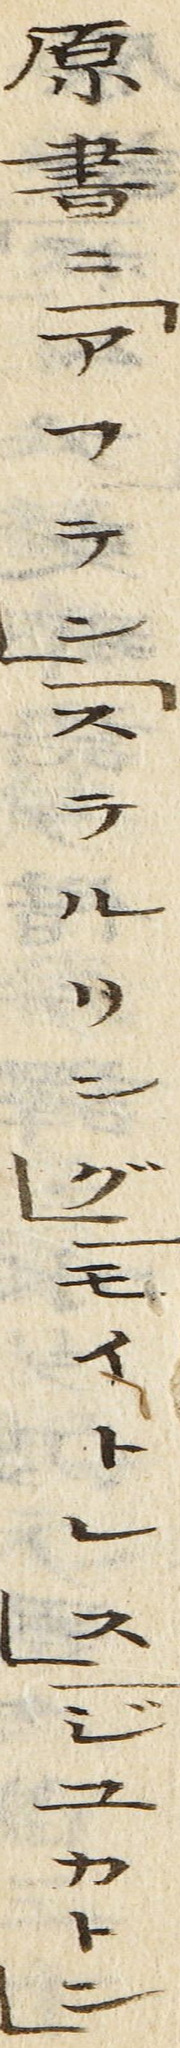原書ニ「アフテン」「ステルリング」「モイトレス」「ジユカトン」
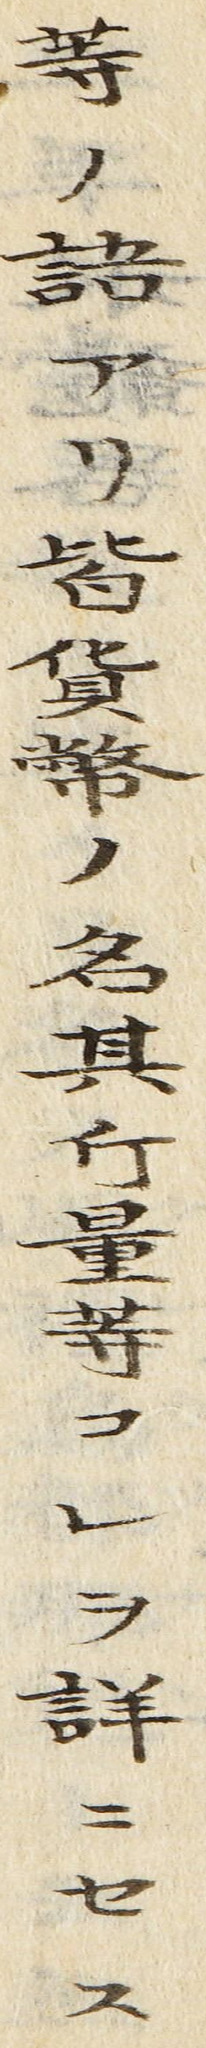等ノ語アリ皆貨幣ノ名其斤量等コレヲ詳ニセス
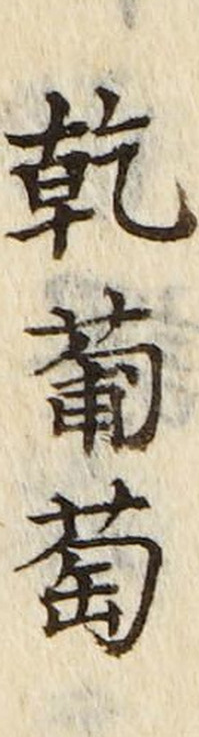乾葡萄
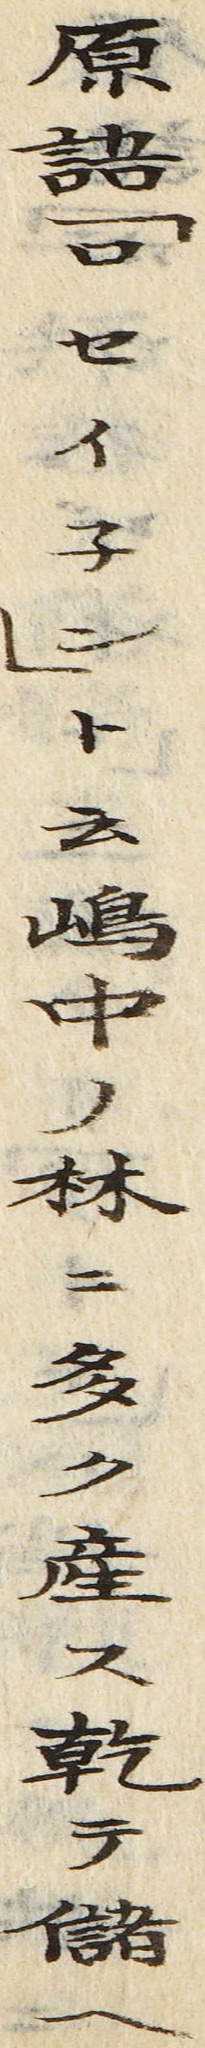原語「ロセイネン」ト云島中ノ林ニ多ク産ス乾テ儲ヘ
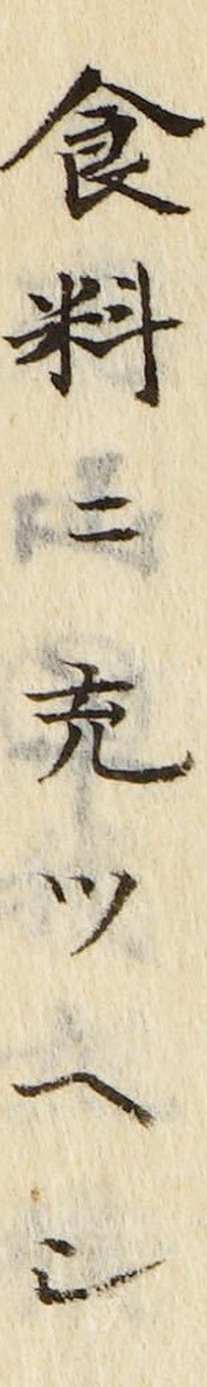食料ニ充ツヘシ

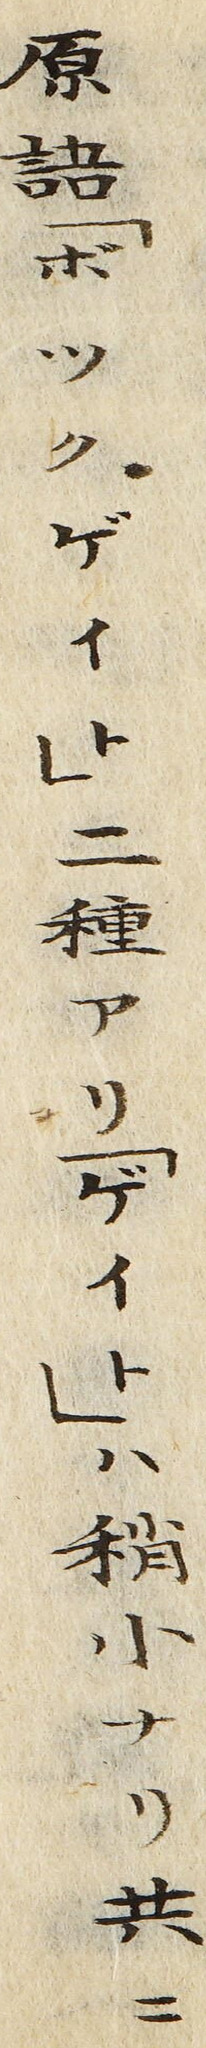原語「ボツク・ゲイト」二種アリ「ゲイト」ハ稍小ナリ共ニ
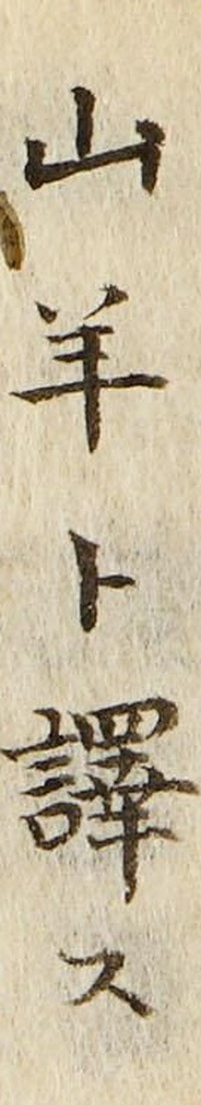山羊ト訳ス
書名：漂流紀事
